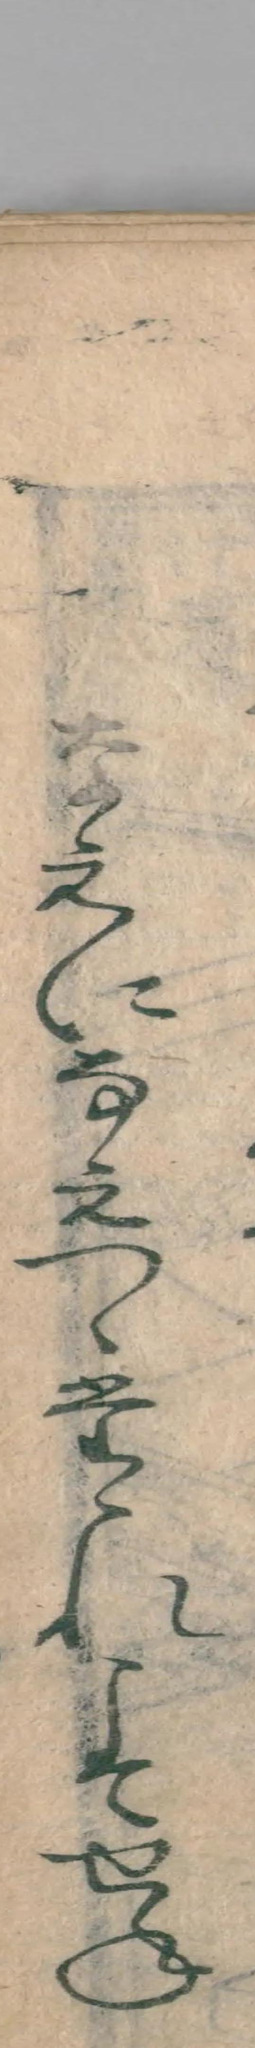なえになえつゝたゝれこそせね
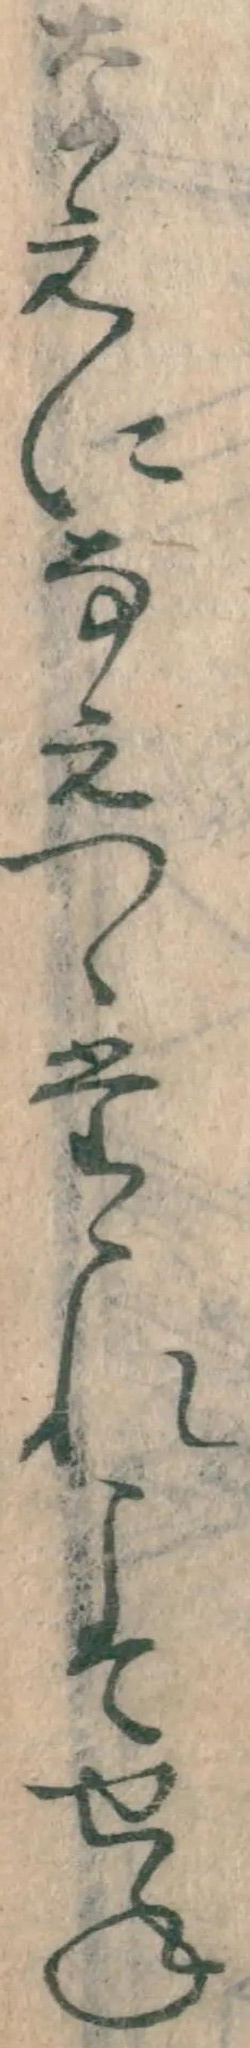なえになえつゝたゝれこそせね

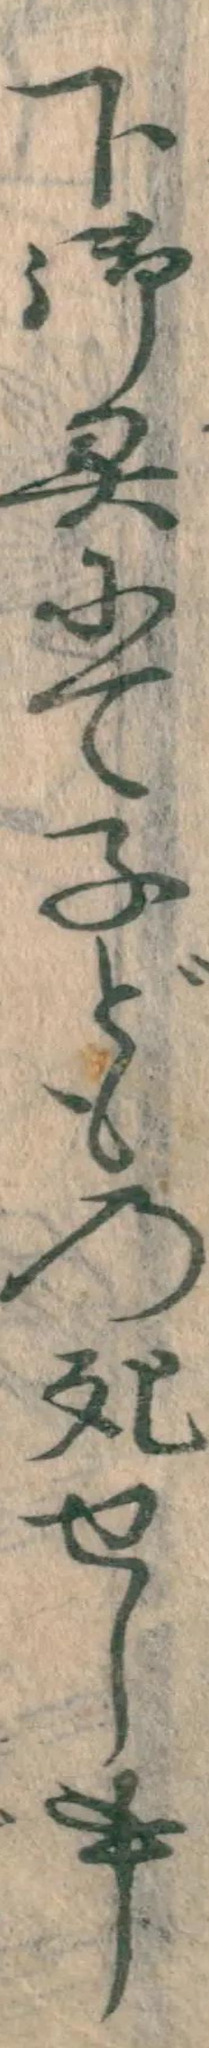三下御灵にて子どもの死せし事
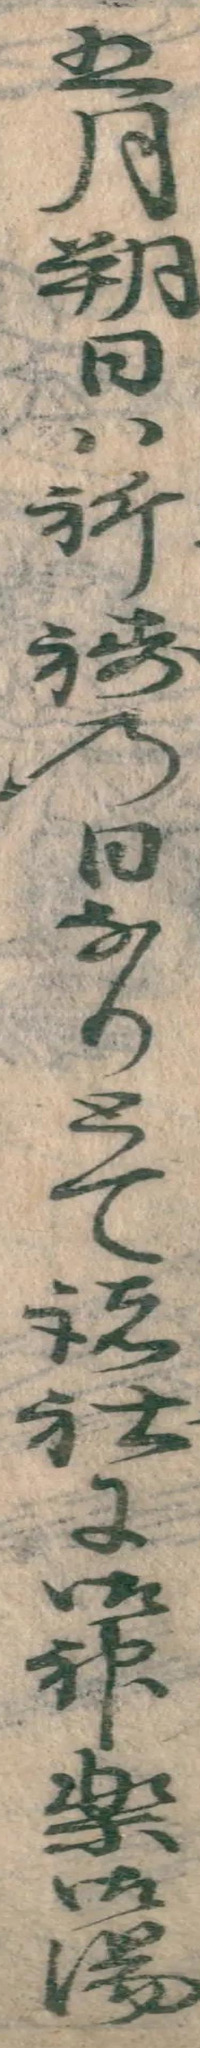五月朔日は祈祷の日なりとて諸社に御神楽御湯
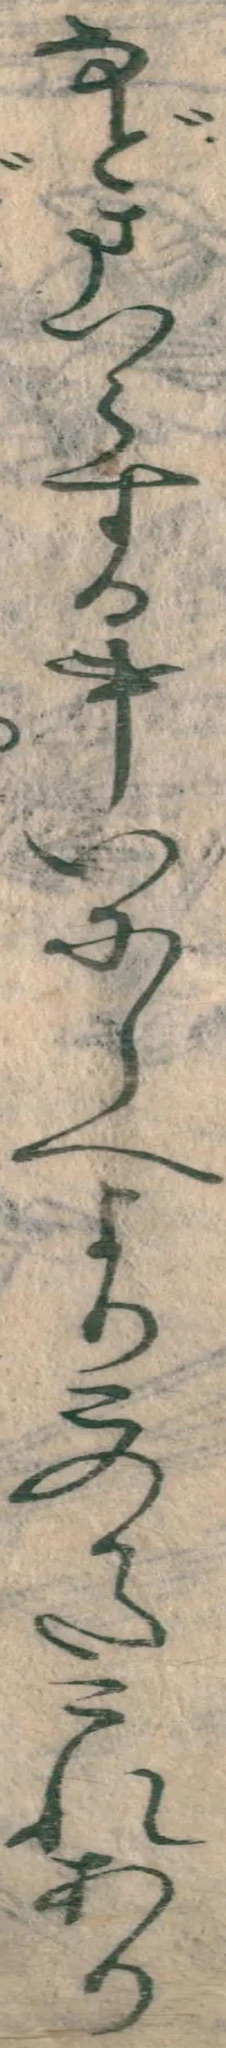などまいらする事いにしへよりこのかたこれあり
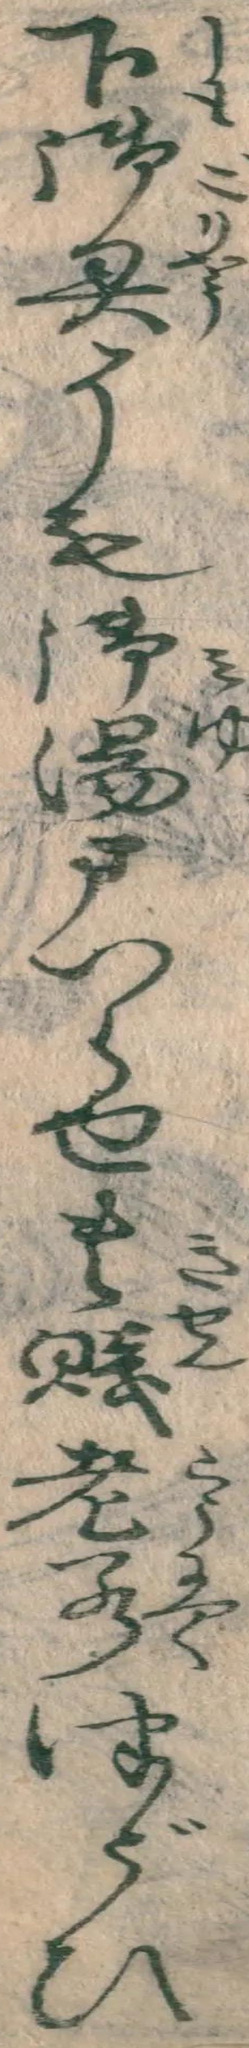下御灵そも御湯まいらせ貴賤老若つどひ
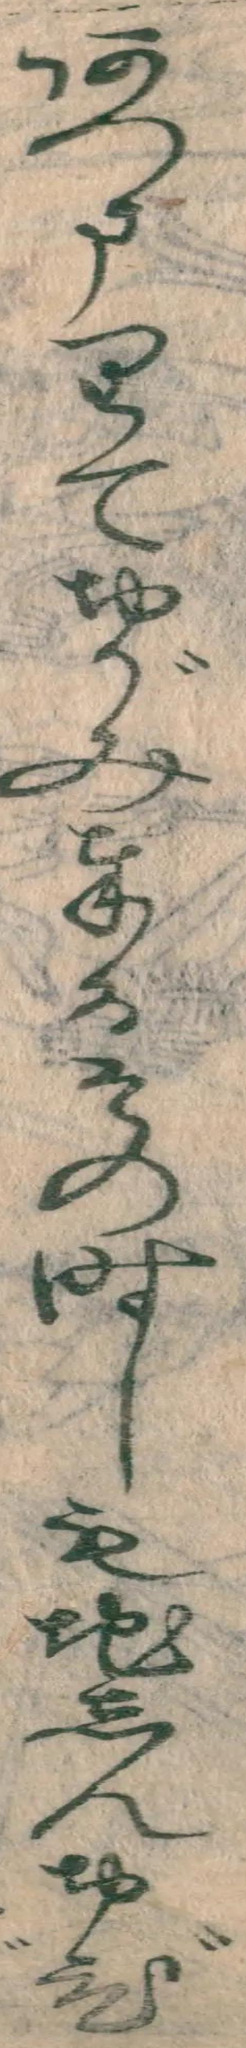あつまりておがみ奉るその時しも地しんおび
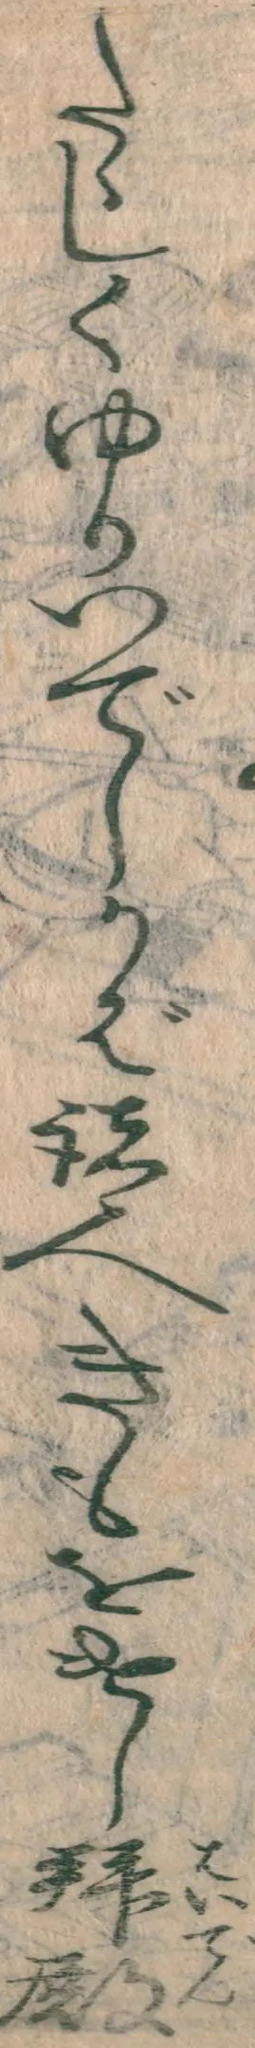たゝしくゆりいでしかば諸人きもをけし拝殿
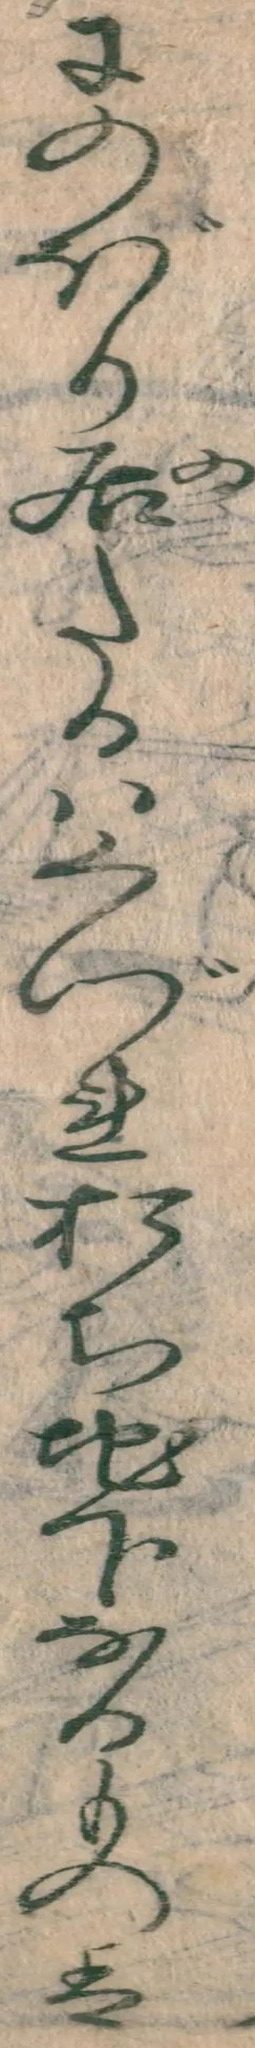にのぼり居たるはくづれおち地下なるものは
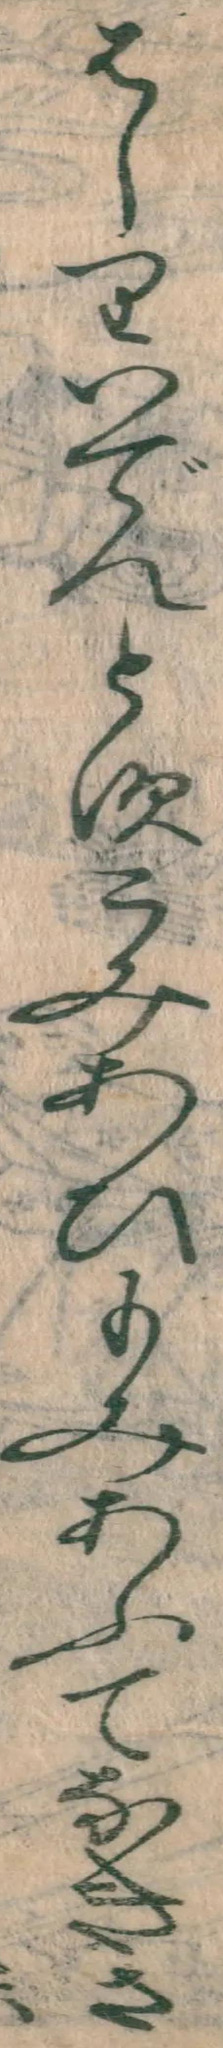はしりいでんとすこみあひもみあふてなきさ
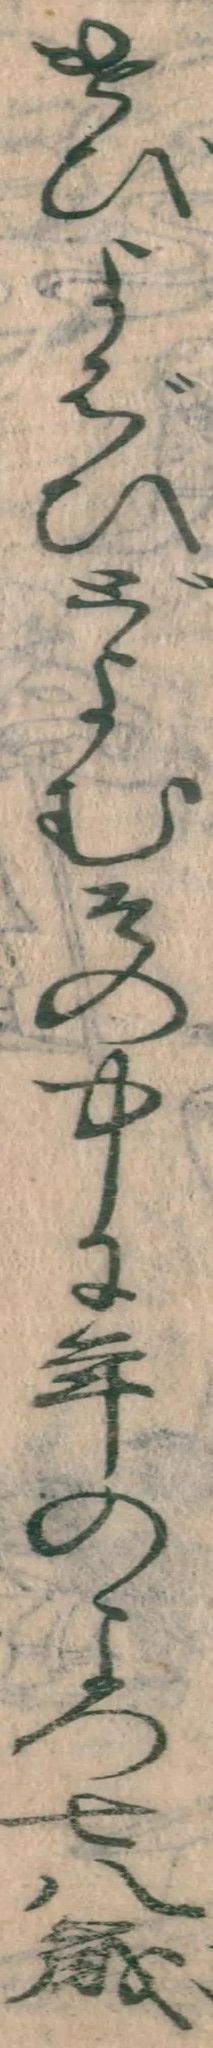けびよばひどよむその中に年のこのころ七八歳
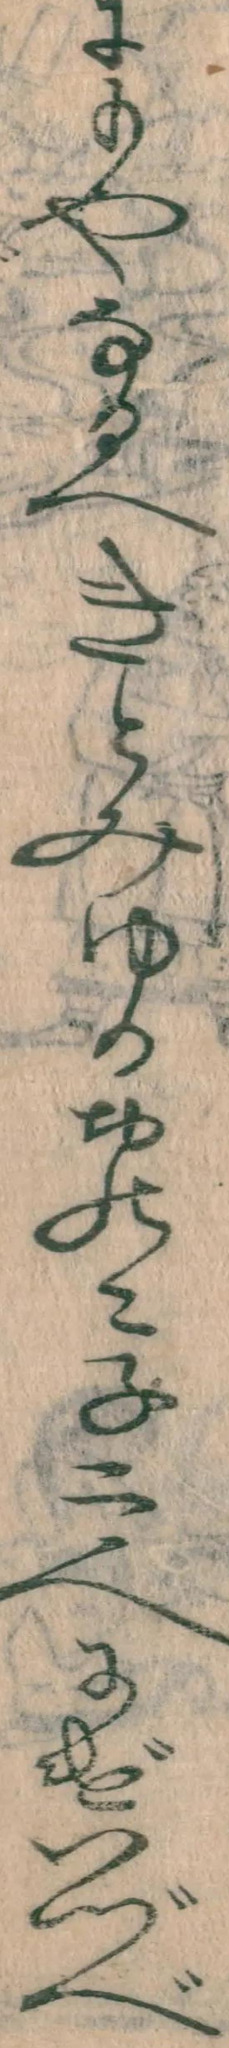にもやなるへきとみゆかおのこ子二人にげいづべ
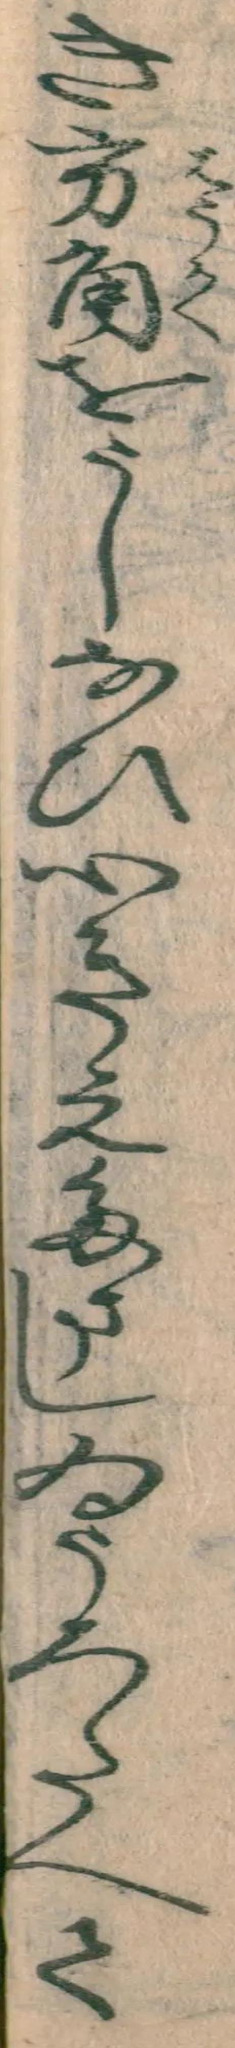き方角をうしなひ心きえたましゐうろたへて
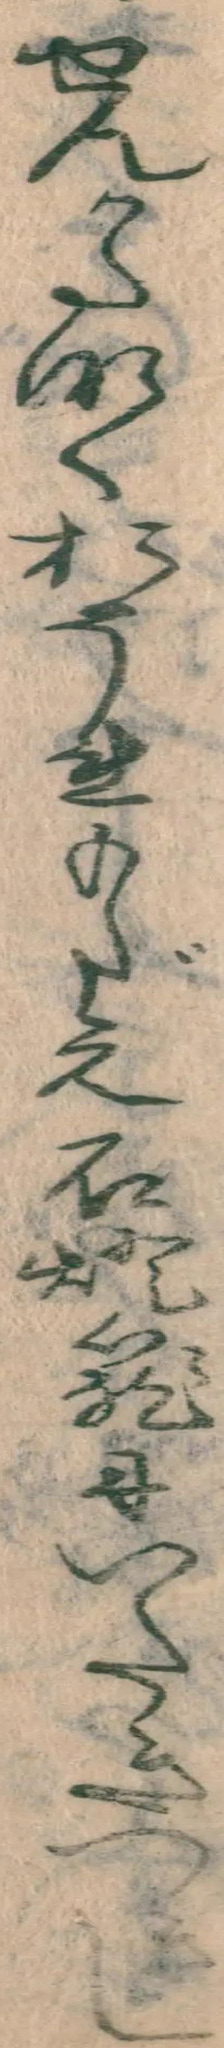せんかたなくおそれもだえ石燈籠にいたきつきし
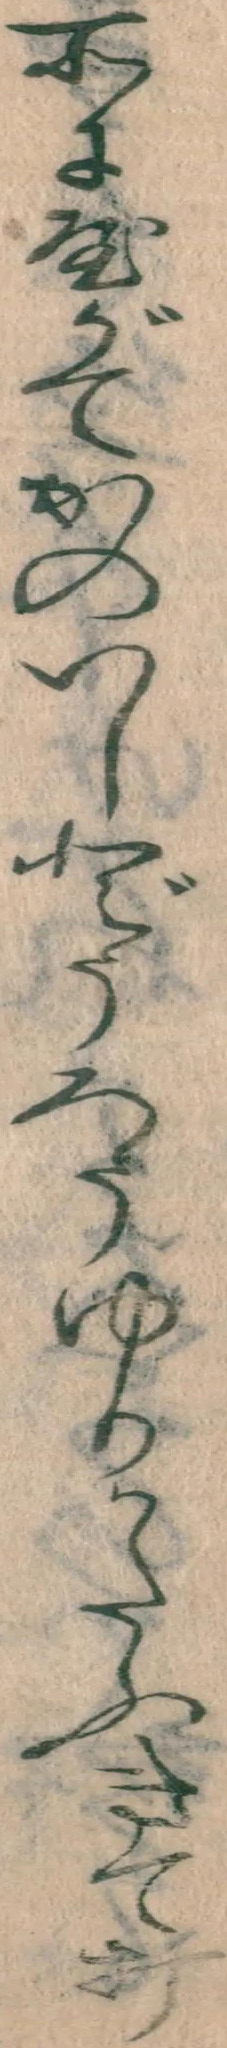所にやがてかのいしどうろうゆりかたふきて折
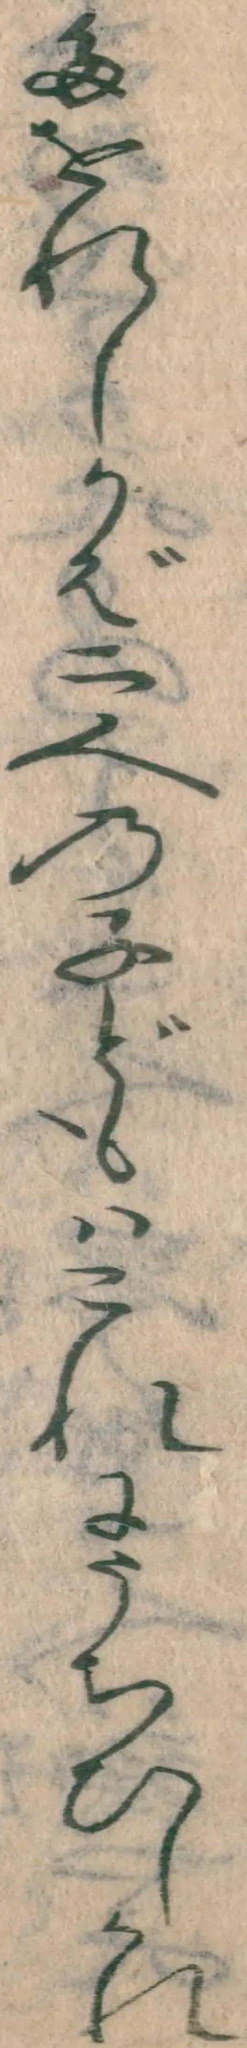たをれしかば二人の子どもはこれにうちひしかれ
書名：艱難目異志. 上,下
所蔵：国立国会図書館 National Diet Library, JAPAN
